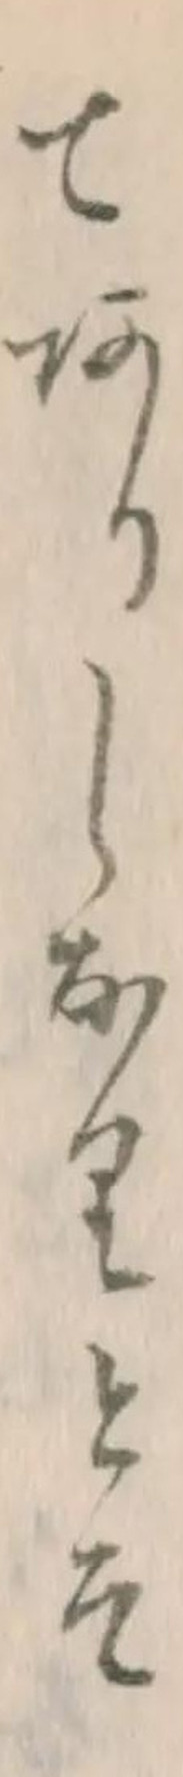てありしなりとそ
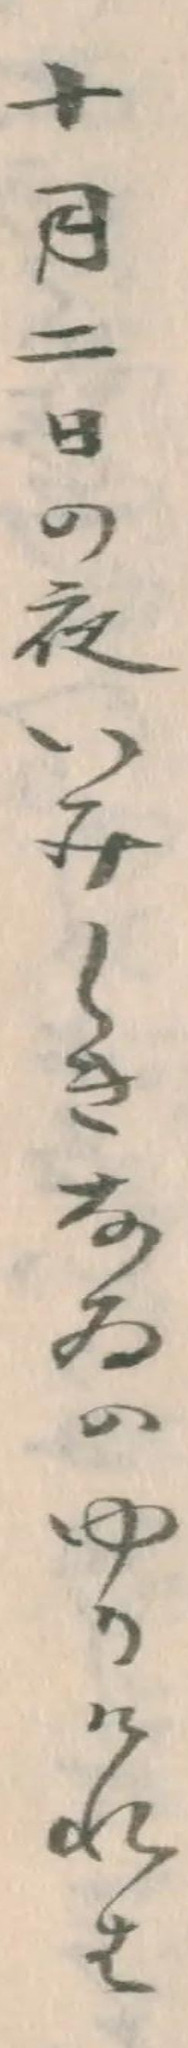十月二日の夜いみしきなゐのゆりけれは
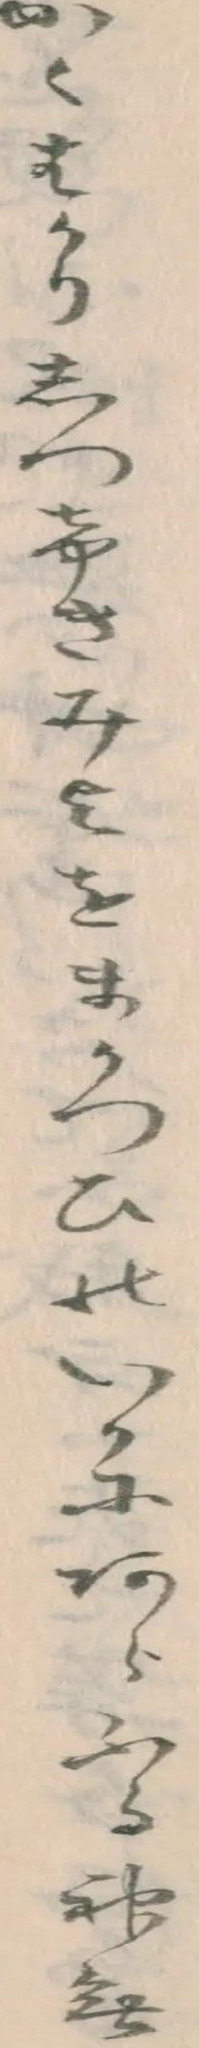かくはかりしつけきみよをまかつひのいかにあらふる神無
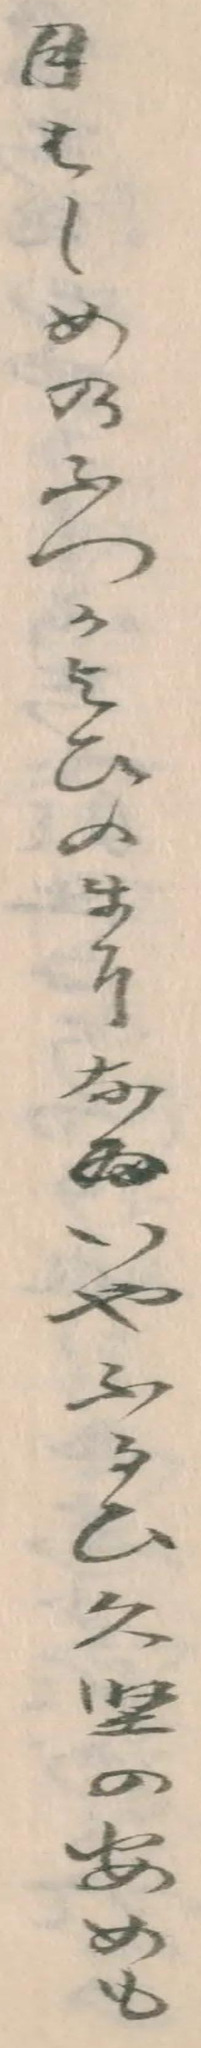月はしめのふつかよひのまになゐいやふるひ久堅のあめも
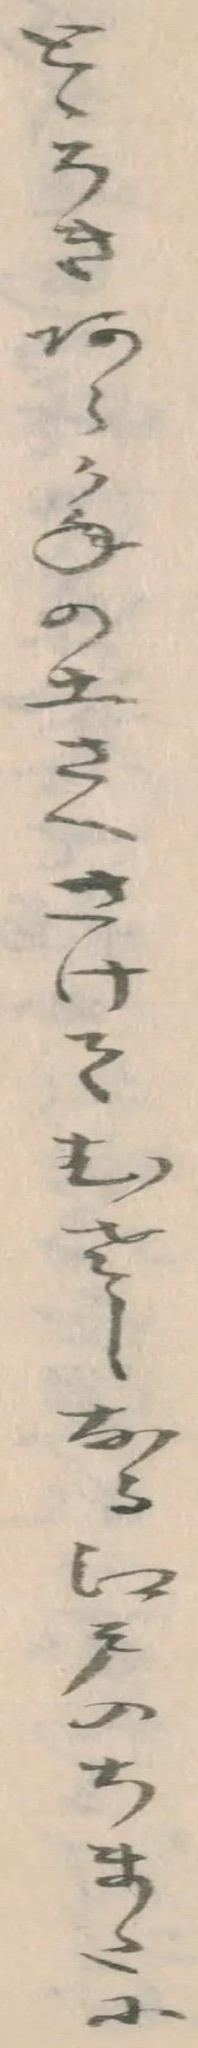とゝろきあらかねの土さへさけてむさしなる江戸のちまたに
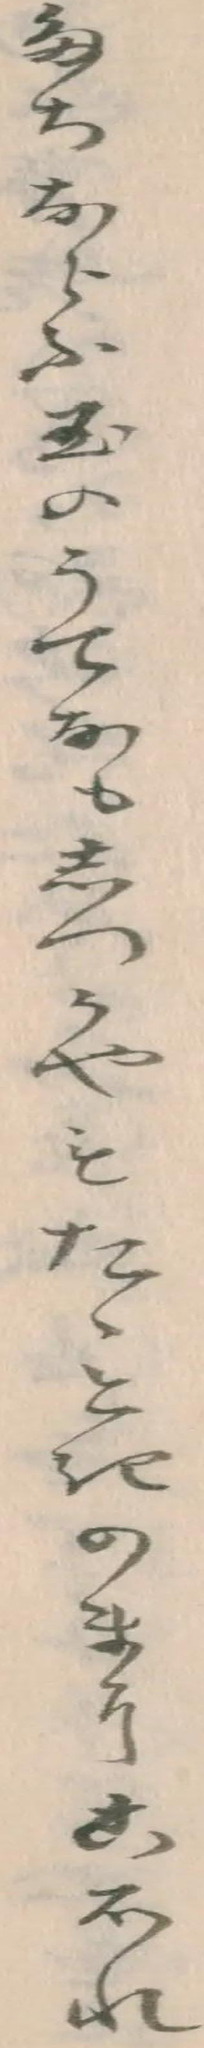たちならふ玉のうてなもしつかやもたゝときのまにこほれ
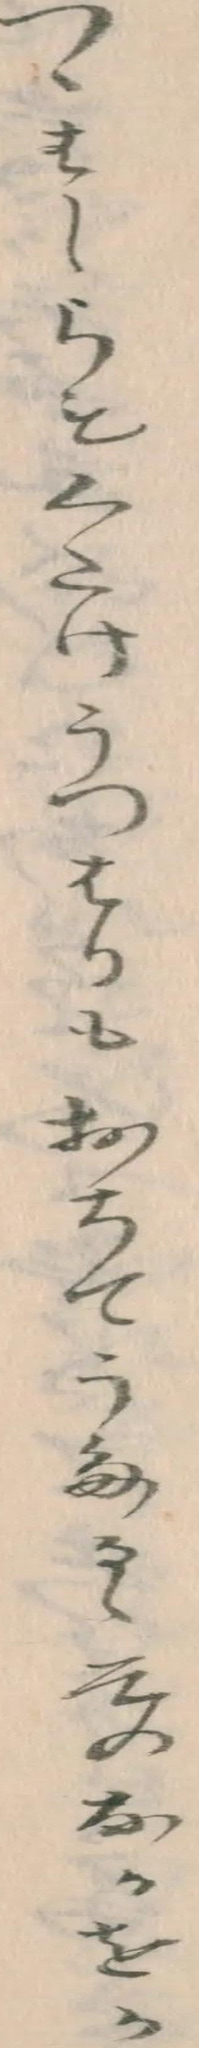つゝはしらもくたけうつはりもおちてうたるゝそのなかをか
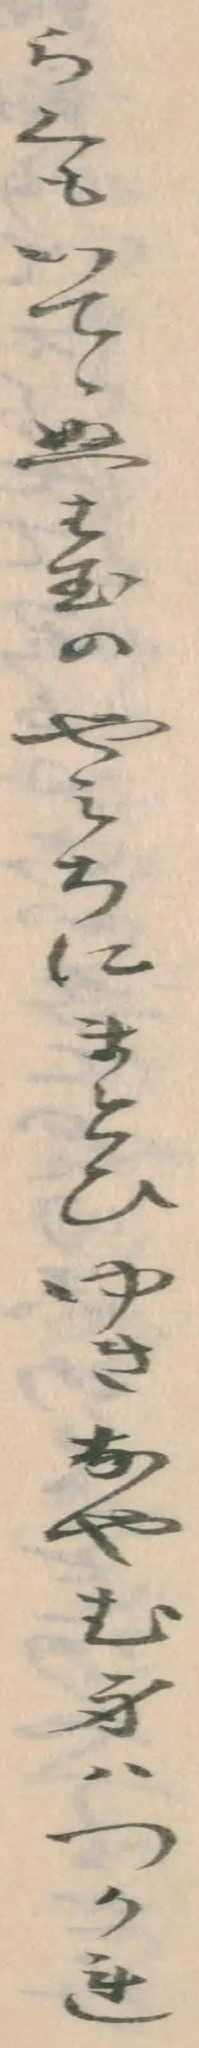らくもいてゝぬは玉のやみちにまとひゆきなやむ身はつかれ
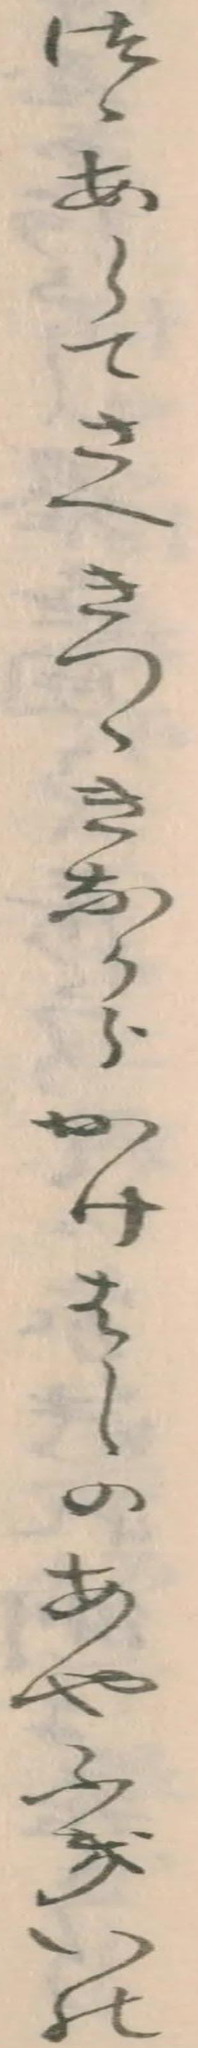つゝあしてさへきつゝきなからかけはしのあやふきいの
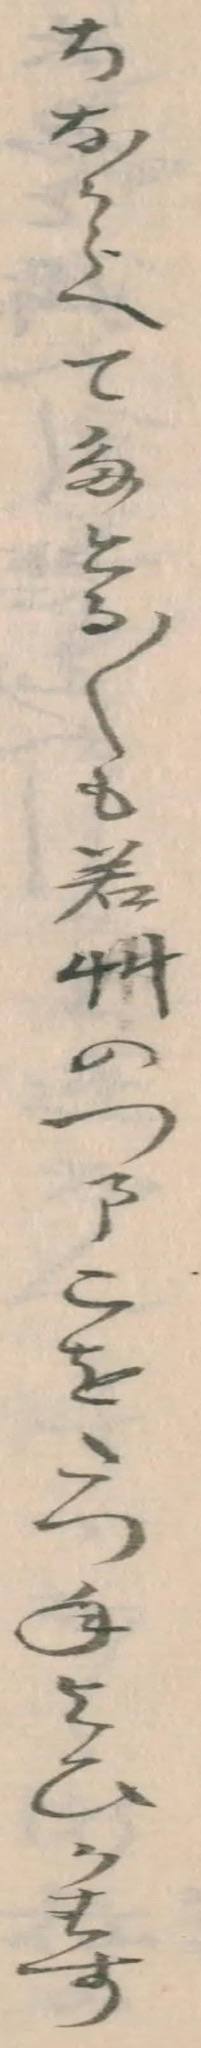ちなからへてたとる〳〵も若草のつまこをたつねよひかはす
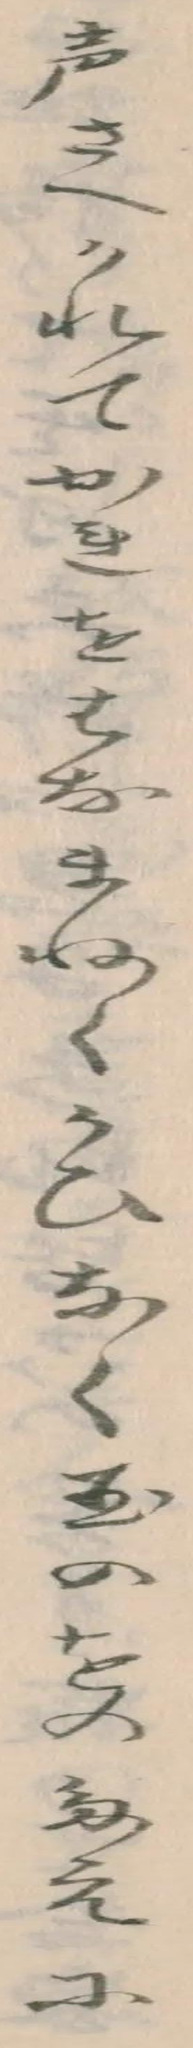声さへかれてかれをはなまねくかひなく玉のをのたえに
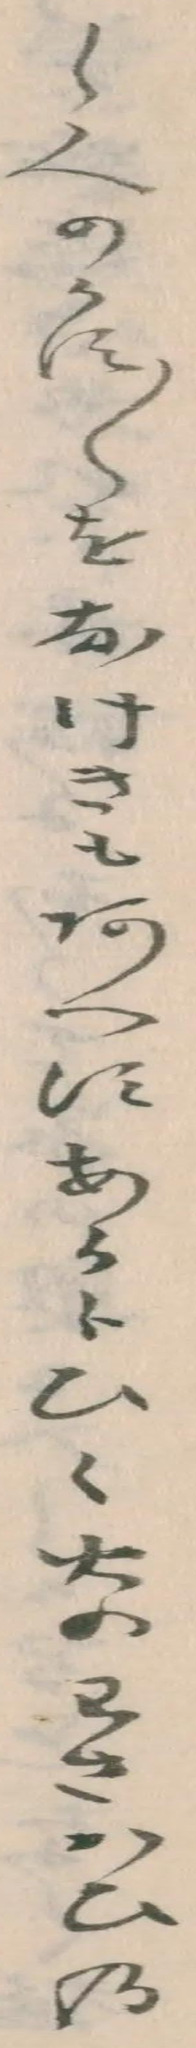し人のかす〳〵をなけきもあへすあからひく火のわさはひの
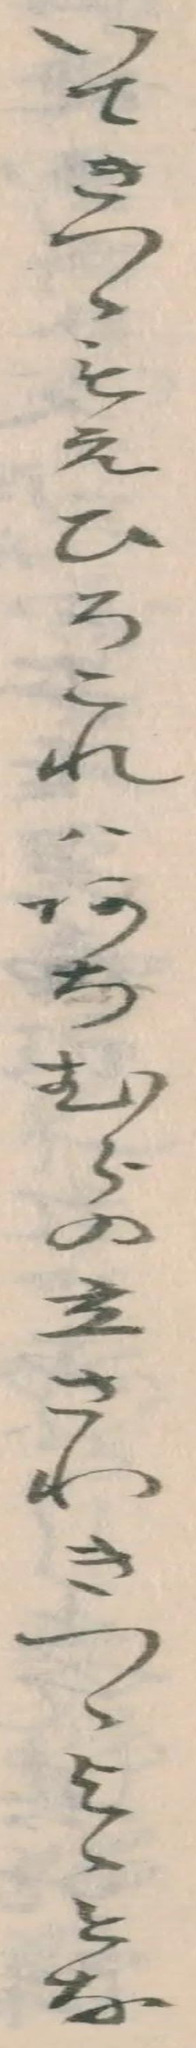いてきつゝもえひろこれはあちむらの立さわきつゝよゝとな
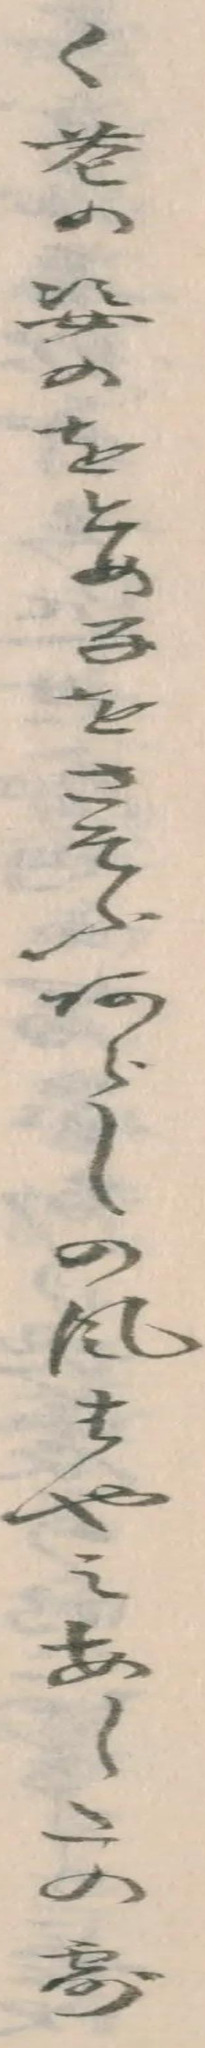く花の姿のをとめ子をさそふあらしの風はやみあしたの露
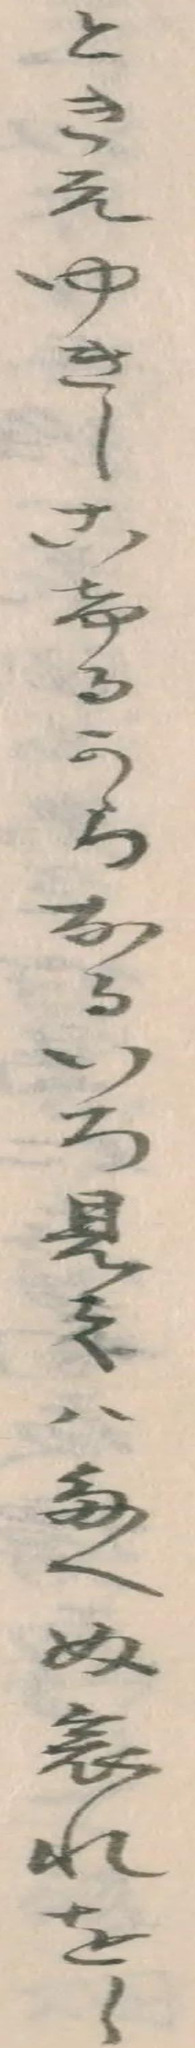ときえゆきしこけるからなるいろ見てはたへぬ哀れをし
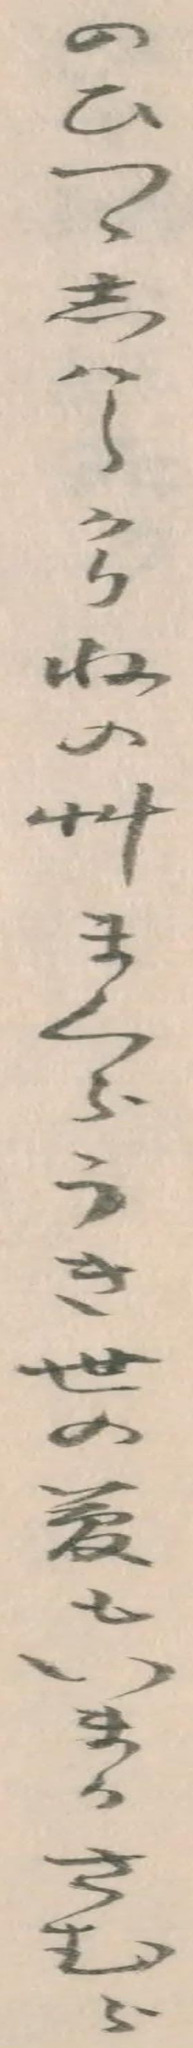のひつゝしはしかりねの草まくらうき世の夢もいまかさむら
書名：地災撮要. 巻10(地震之部) 上,下
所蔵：国立国会図書館 National Diet Library, JAPAN
